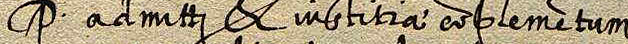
P. admittj & iustitia cōplemētum
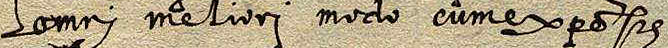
omnj meliorj modo cum expēsis
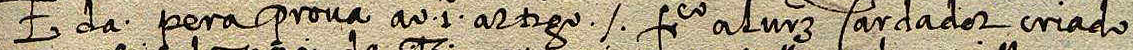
E da. pera Proua ao .1o. artigo ./. frco alur̄z Cardador criado
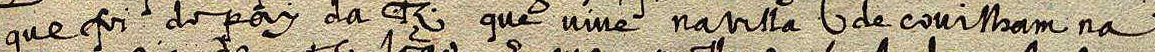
que foi do pay da R. que uiue na villa de couilham na
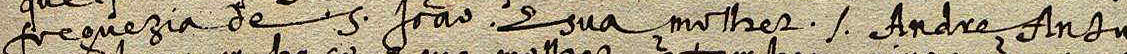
freguezia de S. João . E sua molher ./. Andre Antu
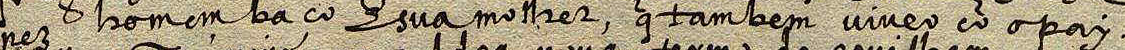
nez homem baço E sua molher, q̄ também uiueo cō o pay
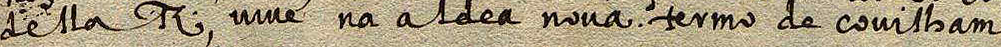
della R., uiue na aldea noua. termo de couilham
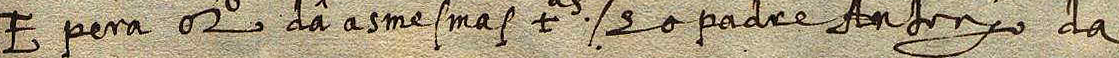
E pera o 2o dâ as mesmas tas. / E o padre Antonjo da
